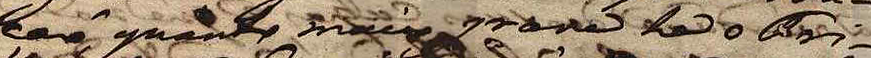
çaõ, quanto mais grave he o Tri
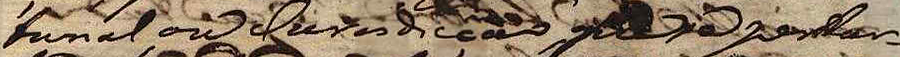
bunal ou Iurisdicçaõ, que se pertur
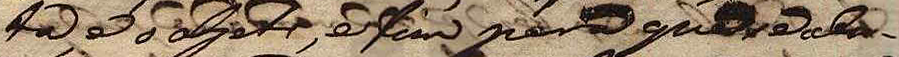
ba, e o objeto, e sim para que se abu
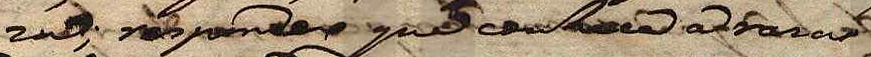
za; respondeo que conhece a razaõ
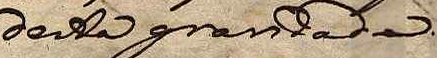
desta grandade.
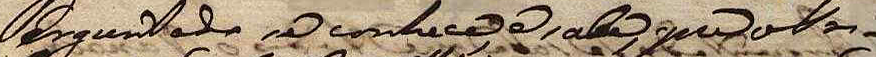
Perguntado se conhece, e sabe, que o Tri
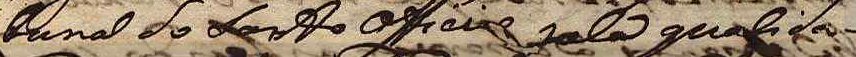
bunal do Santo Offici_ pela qualida
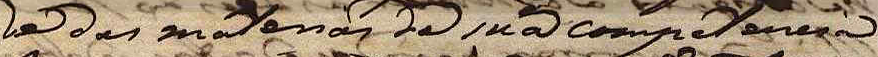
de das materias da sua competencia
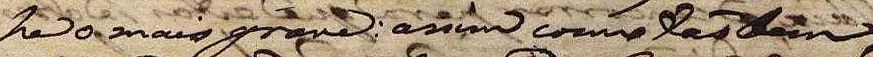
he o mais grave: assim como taõbem
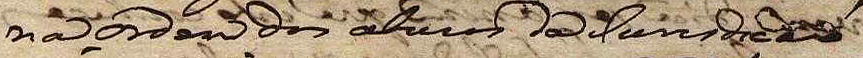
na ordem dos abuzos da Iurisdicaõ
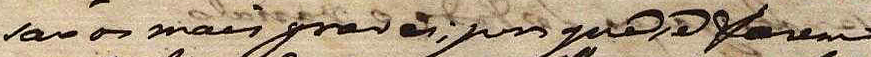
saõ os mais graves; por que, se fazem
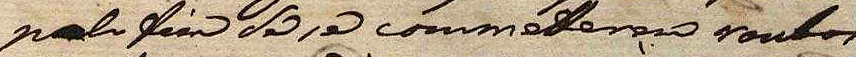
p_lo fim de se commetterem roubos,
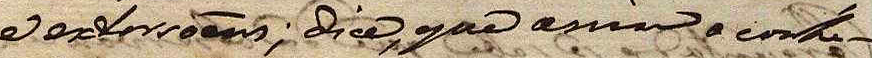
e extorsoẽns; dice, que assim o conhe
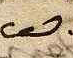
ce.
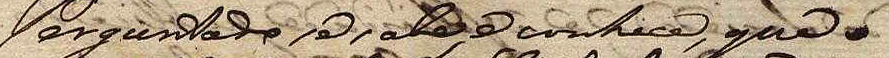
Perguntado se sabe, e conhece, que o
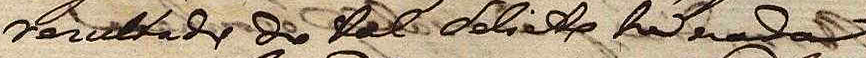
rezultado do tal delito he nada
